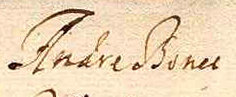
Andre Bonet
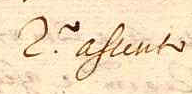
2.o assento
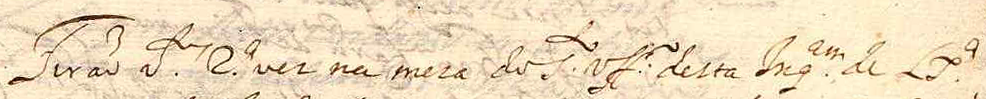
Foraõ d.os 2.a vez na meza do s.to off.o desta Inq.am de Lx.a
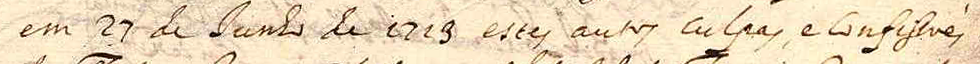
em 27 de Iunho de i713 estes autos culpas, e Confissoẽs
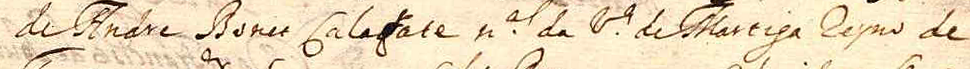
de Andre Bonet Calafate n.al da V.a de Martiga Reyno de
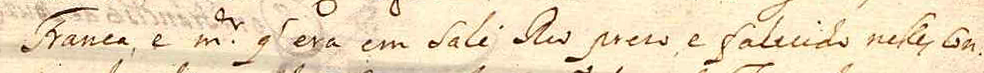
França, e m.or q̄ era em Salé Reo prezo, e falecido nelles Con
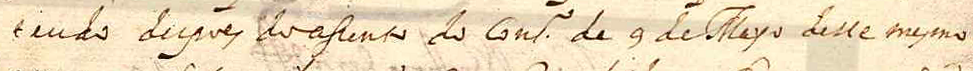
teudo dispoes do assento do Cons.o de 9 de Mayo deste mesmo
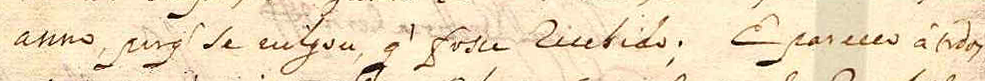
anno, porq̄ se iulgou, q̄ fosse Recebido; E pareceo á todos
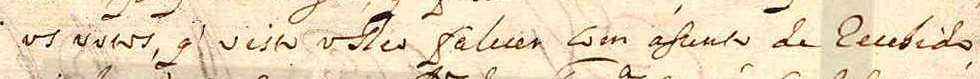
os votos, q̄ visto o Reo falecer Com assento de Recebido,
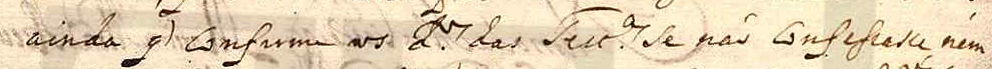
ainda q̄ conforme os d̄.os das Test.as se naõ Confessasse nem
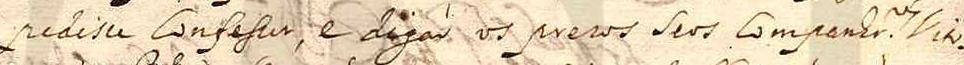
pedisse Confessar, e digaõ os prezos seos Companhr.os Vito
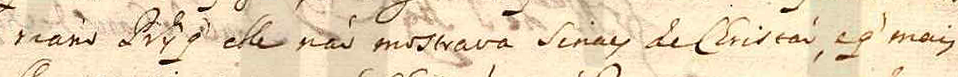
riano Prya q̄ elle naõ mostrava sinaes de Christaõ, e q̄ mais
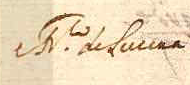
Fr.co de Lucena
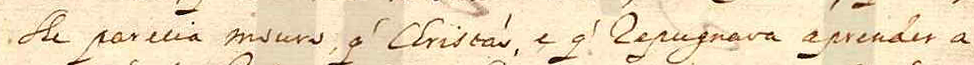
lhe parecia mouro, q̄ Christaõ, e q̄ Repugnava aprender a
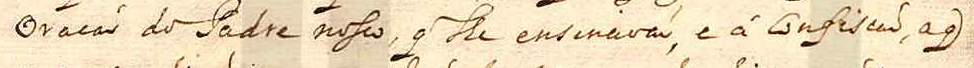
Oraçaõ do Padre nosso, q̄ lhe ensinavaõ, e á confisçaõ, a q̄
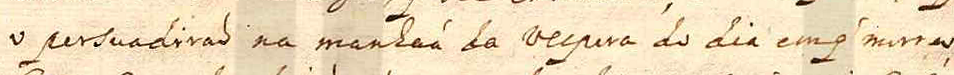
o persuadiraõ na manhaã da vespera do dia em q̄ morreo,
